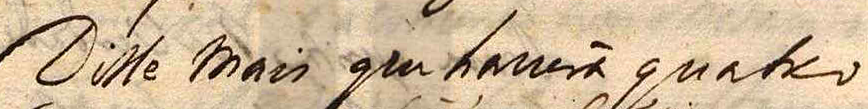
Disse mais que hauerà quatro
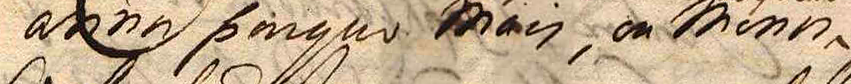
annos pouquo mais ou menos
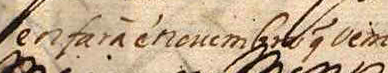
e os farà ē nouembro q̄ vem
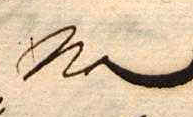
na
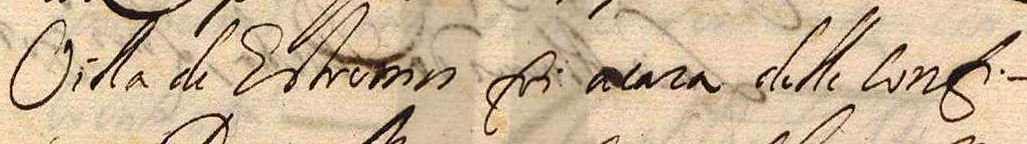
Villa de Estremos foi a caza delle confi
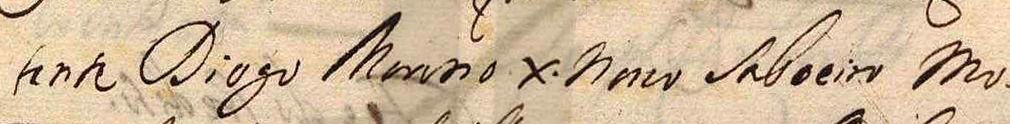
tente Diogo Moreno x. nouo saboeiro mo
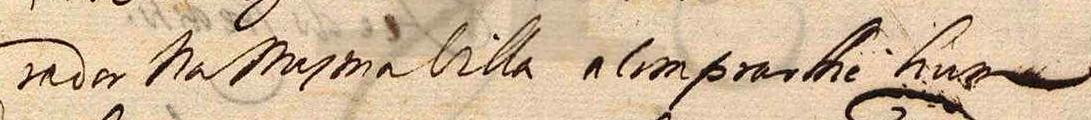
rador na mesma Villa a comprar lhe hum
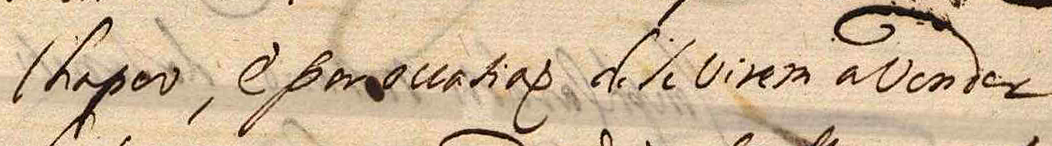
Chapeo, e por occasiaõ de se virem a vender
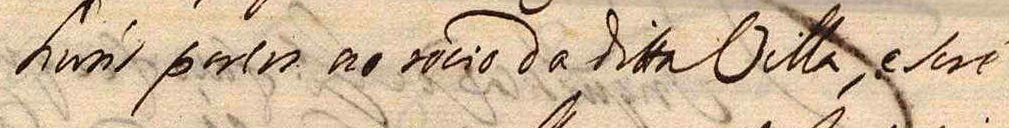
huns porcos no rocio da ditta Villa, e serē
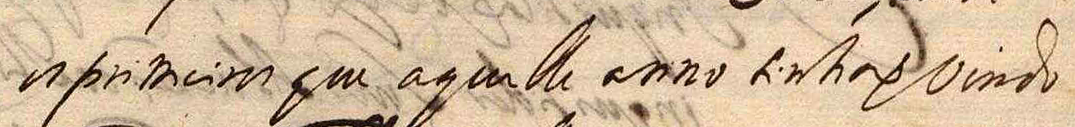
os primeiros que aquelle anno tinhaõ uindo
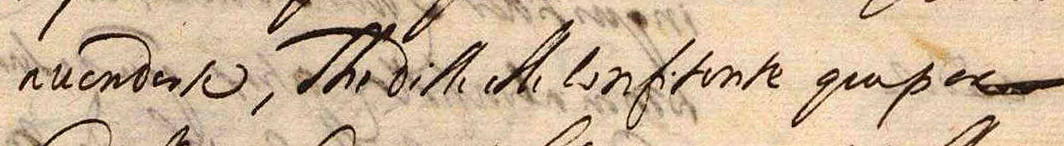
a uendese, lhe disse elle confitente que por
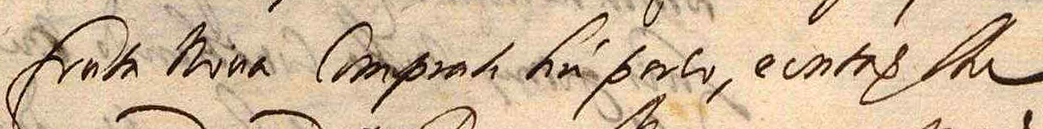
fruta noua comprase hū porco, e entaõ lhe
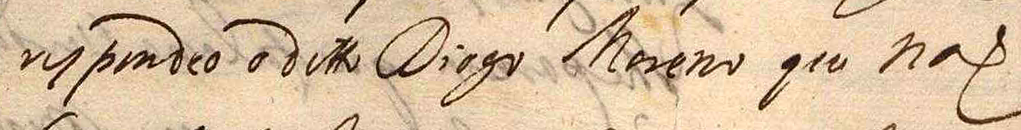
respondeo o ditto Diogo Moreno que naõ
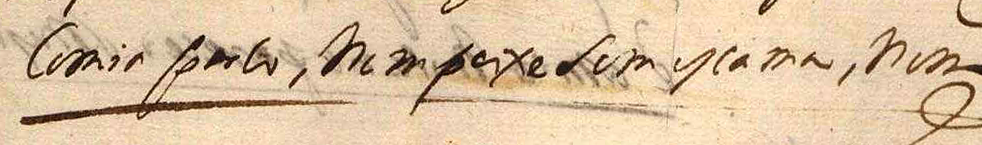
comia porco, nem peixe sem escama, nem
